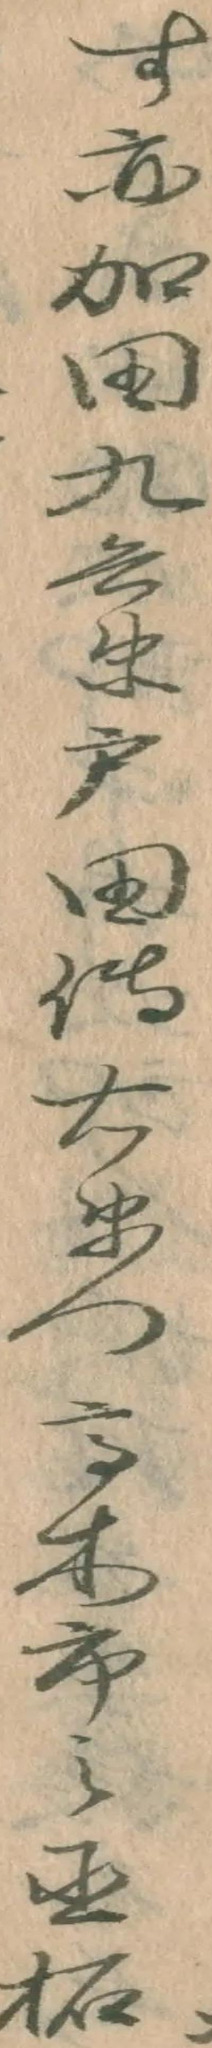す亦加田九兵衛戸田伝右衛門高木市之丞柘
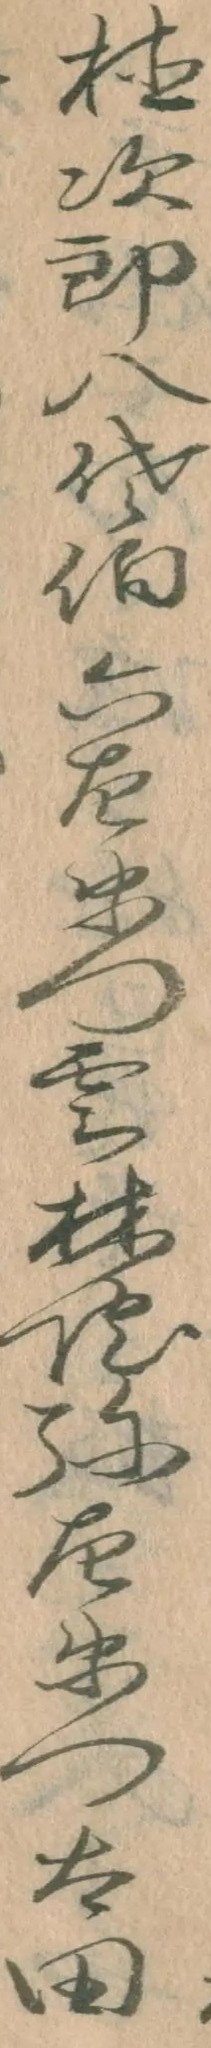植次郎八佐伯六左衛門雲林院弥左衛門太田
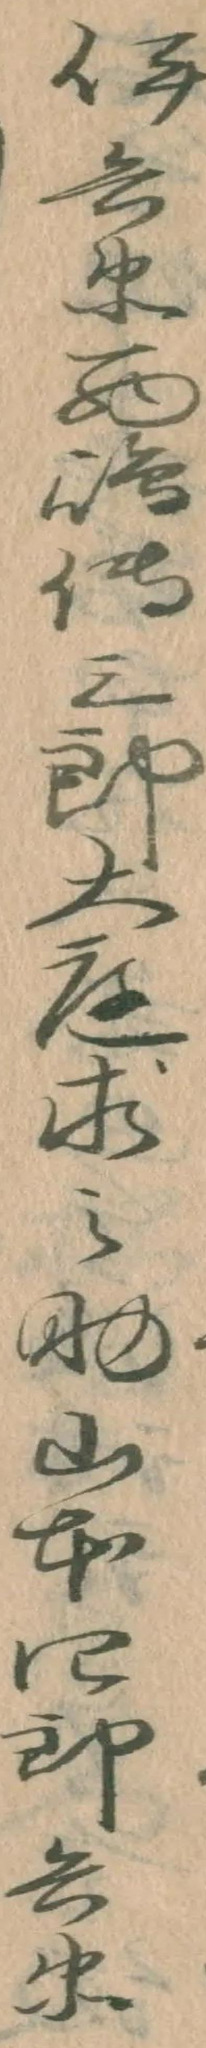伊兵衛西島伝三郎大庭求之助山本四郎兵衛
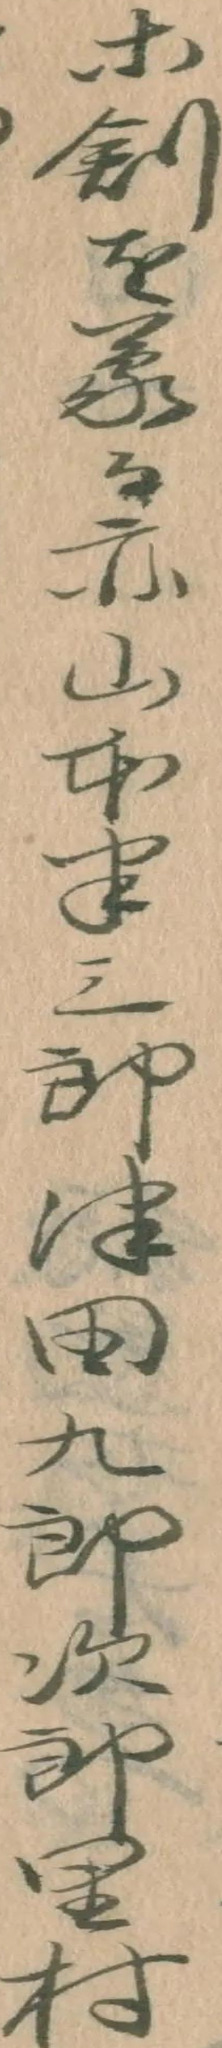等創を承る亦山本半三郎津田九郎次郎里村
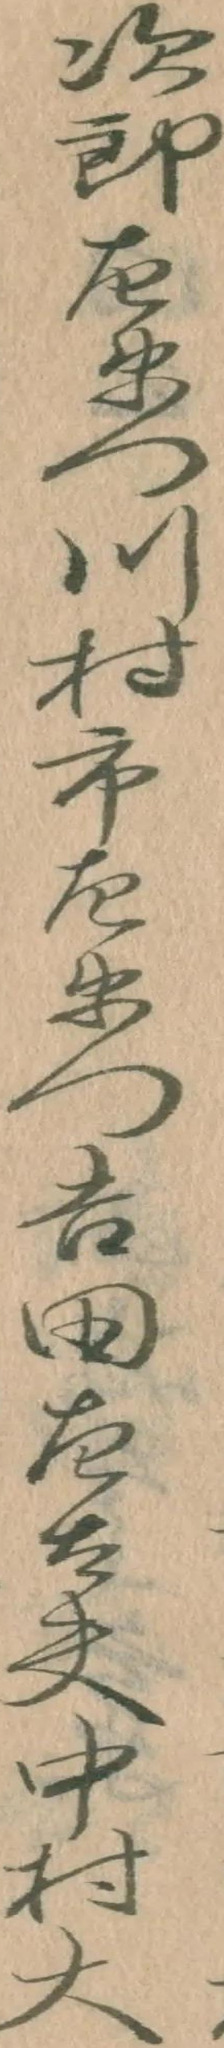次郎左衛門川村市左衛門吉田左太夫中村大
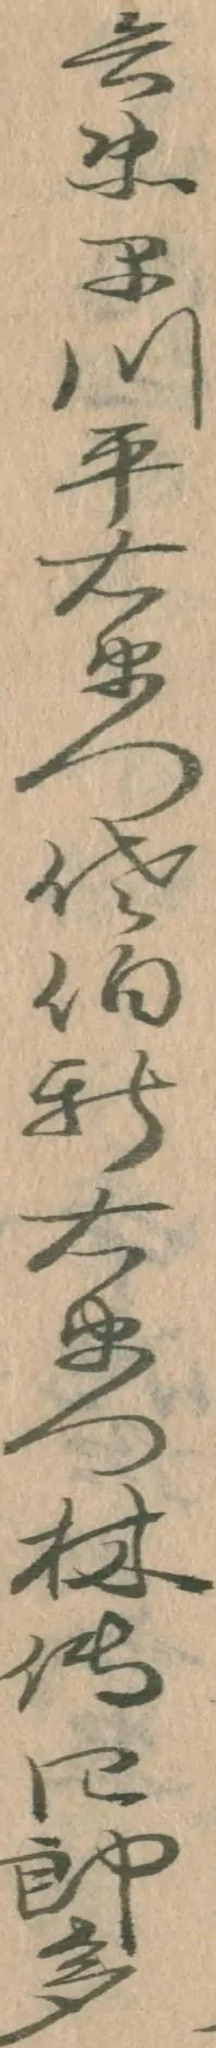兵衛早川平右衛門佐伯新右衛門林伝四郎多
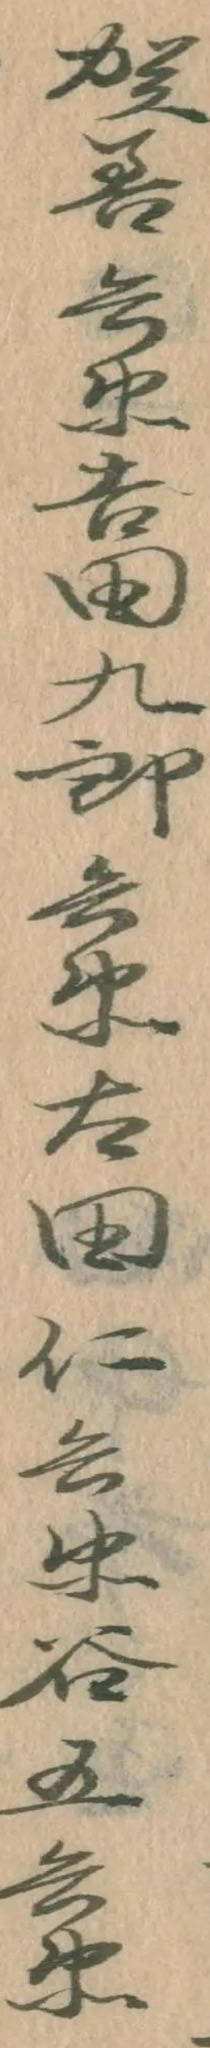賀前兵衛吉田九郎兵衛太田仁兵衛谷五兵衛
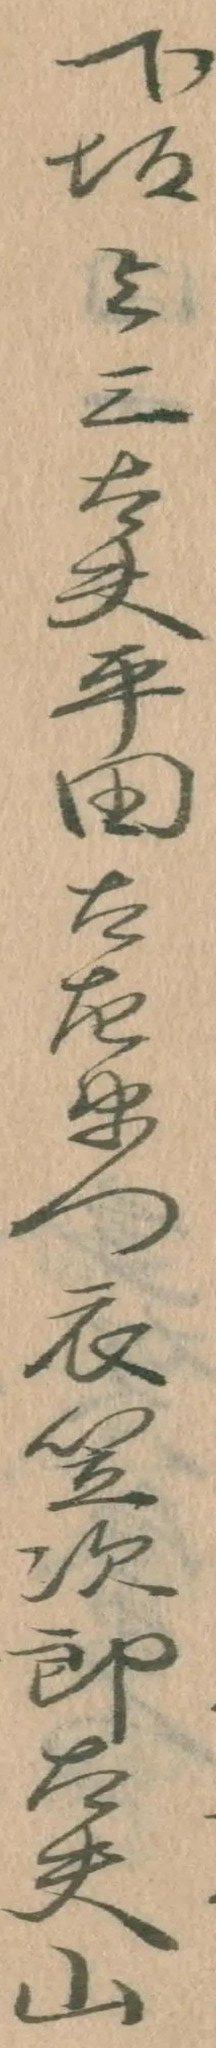下坂与三太夫平田太左衛門衣笠次郎太夫山
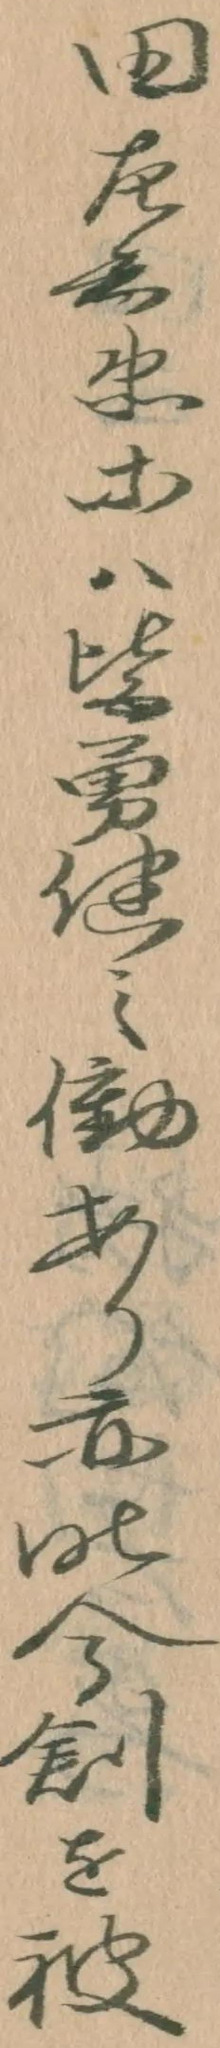田左兵衛等は皆勇健之働あり亦昨今創を被
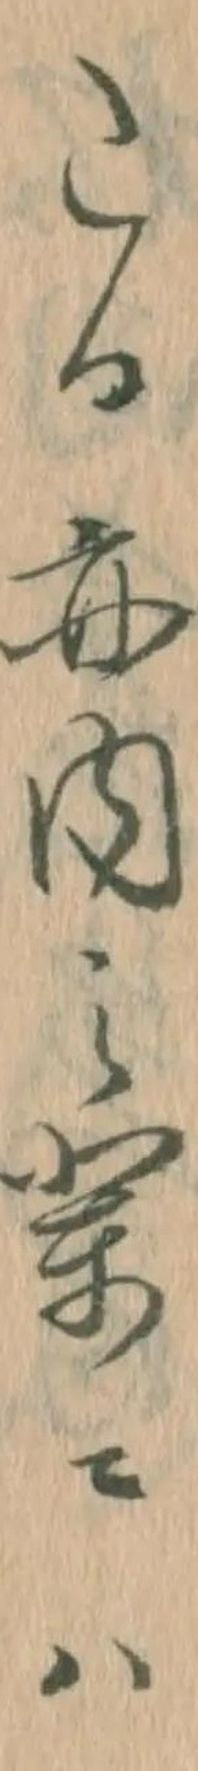たる亦内之輩には
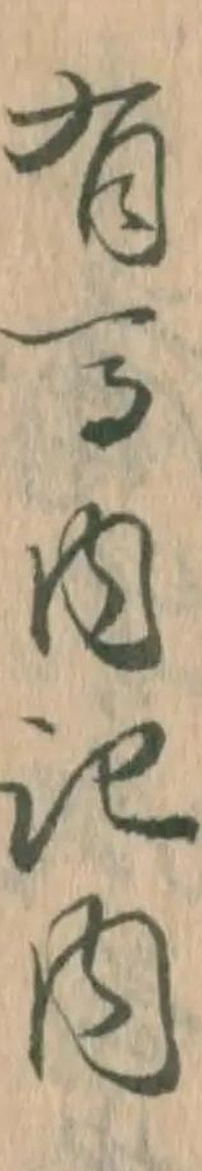有馬内記内
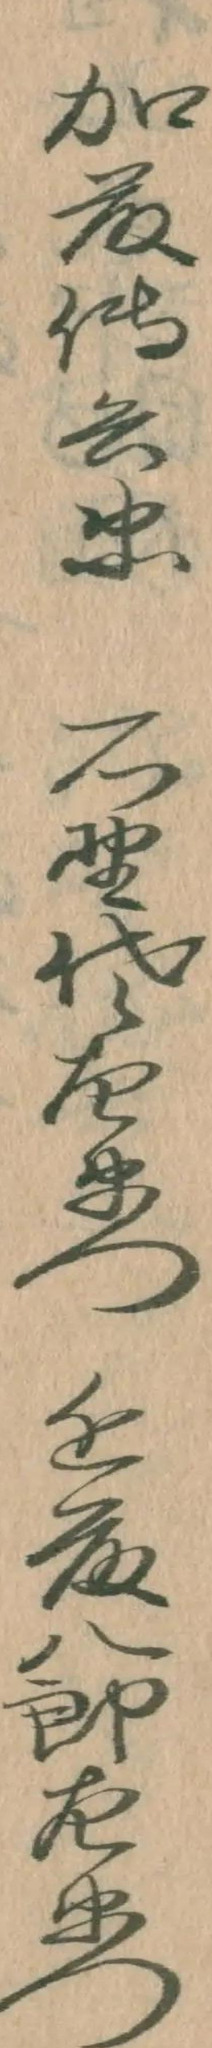加藤伝兵衛石野佐左衛門近藤八郎左衛門
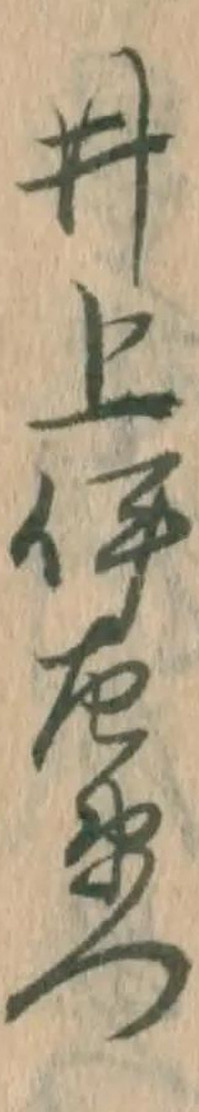井上伊左衛門
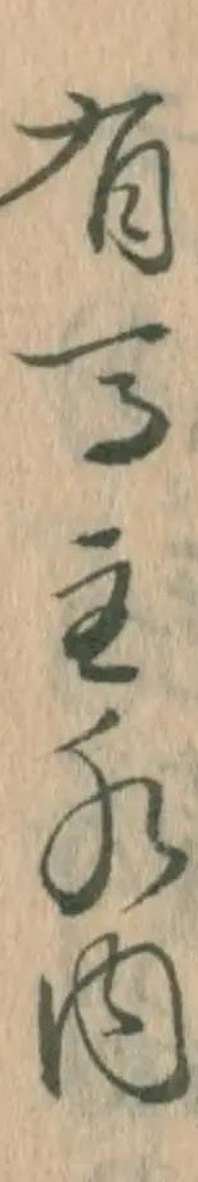有馬主水内
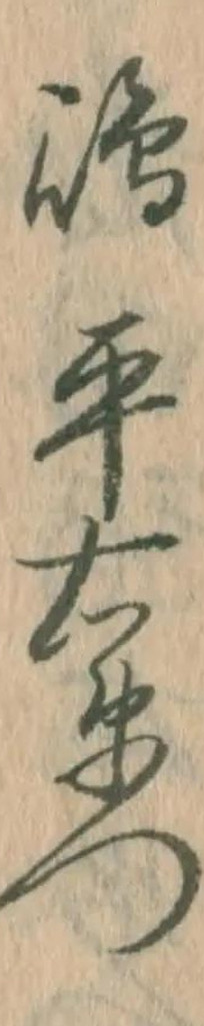島平右衛門
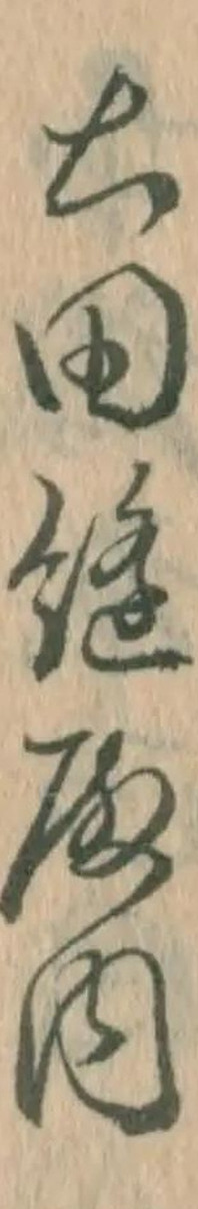太田縫殿内
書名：切支丹御退治記 49巻. [9]
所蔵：国立国会図書館 National Diet Library, JAPAN
